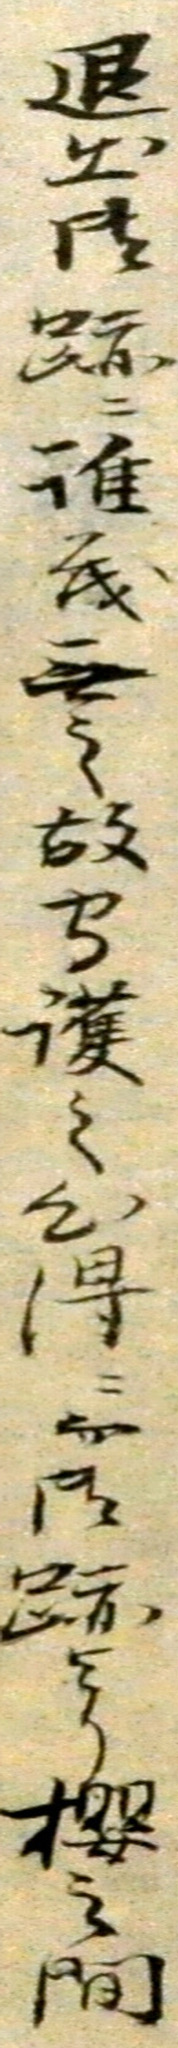退出御跡ニ誰も無之故守護之心得ニ而御跡より櫻之間
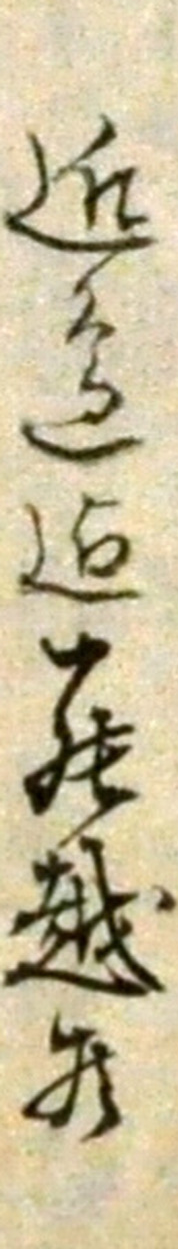近辺迄罷越候

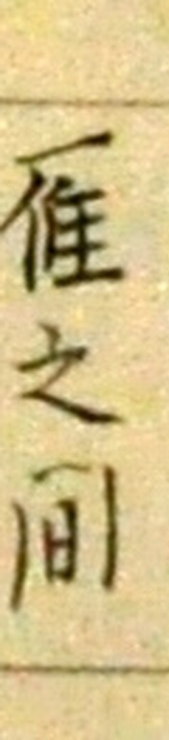雁之間
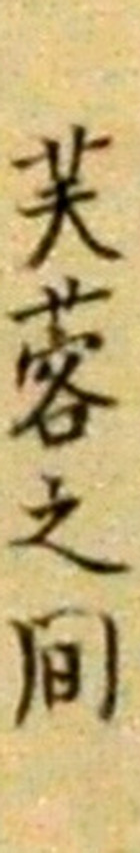芙蓉之間
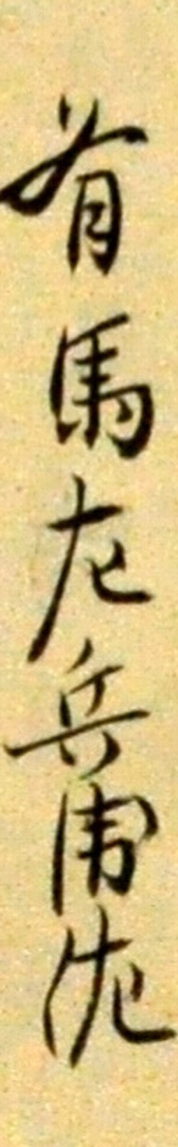▲左兵衛佐

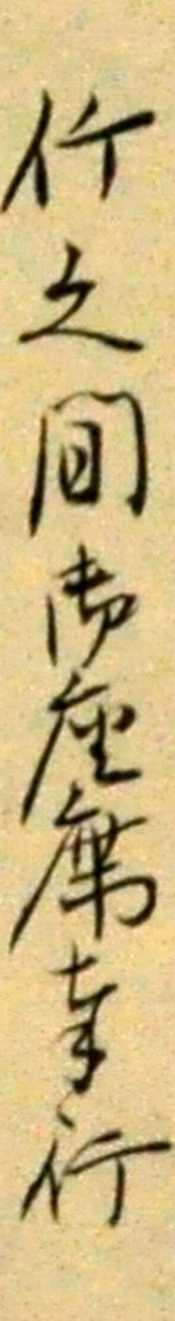竹之間御座席奉行
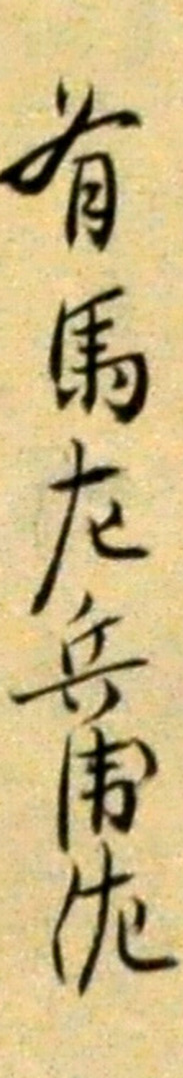有馬左兵衛佐
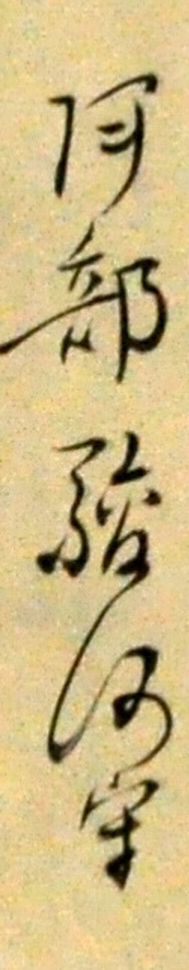阿部駿河守
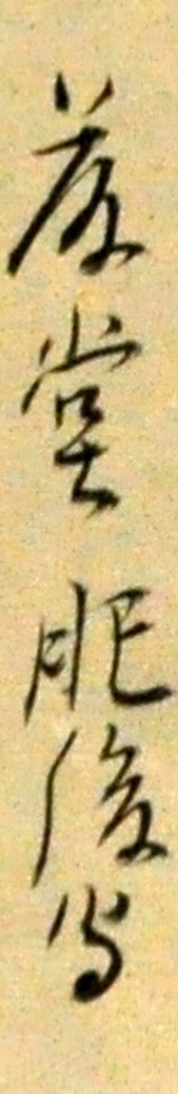藤堂肥後守
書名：竹ノ間御座席奉行勤方控外
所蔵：伊那市立高遠町図書館・合同会社AMANE
